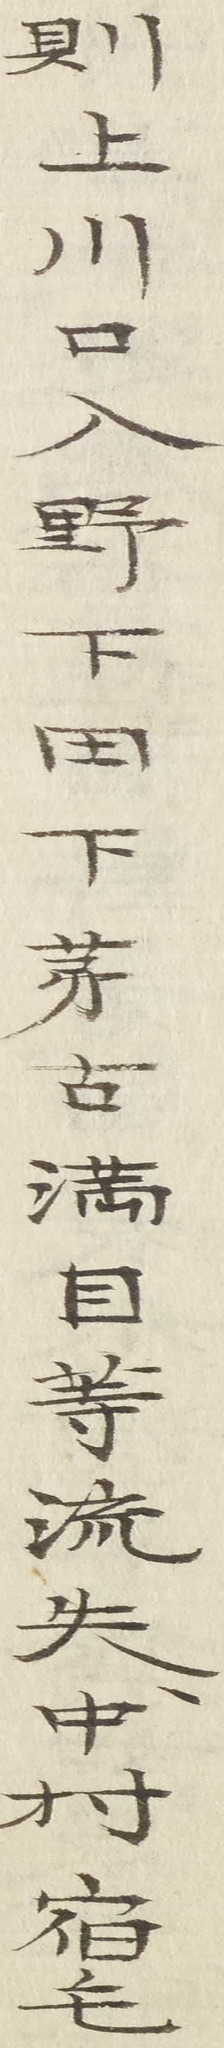則上川口入野下田下茅古満目等流失中村宿毛
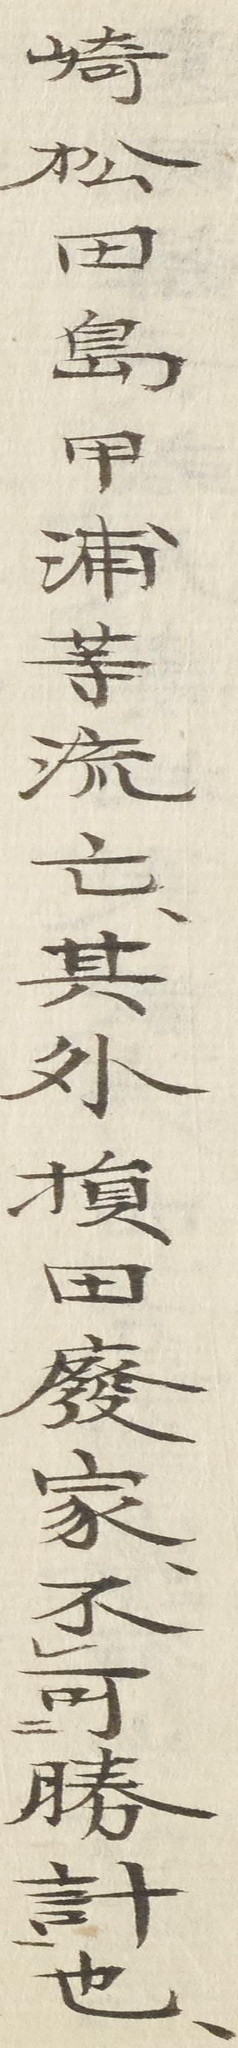崎松田島甲浦等流亡、其外損田廃家、不可勝計也、
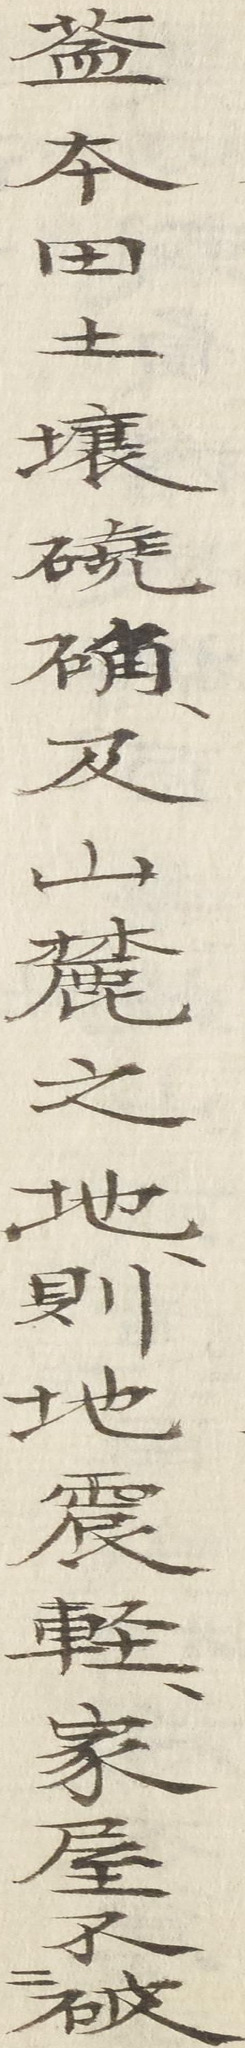蓋本田土壌磽确、及山麓之地、則地震軽、家屋不破
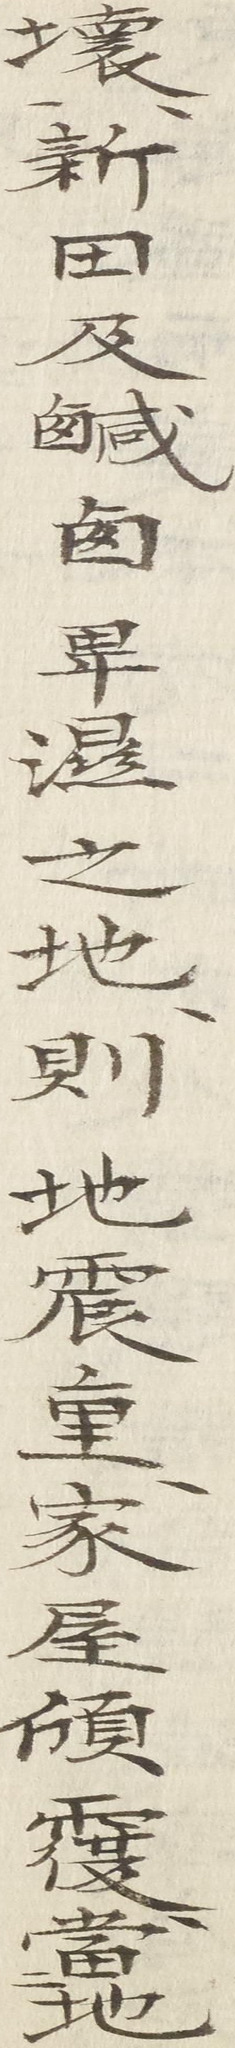壊、新田及鹹卥畢湿之地則地震重、家屋傾覆、当地
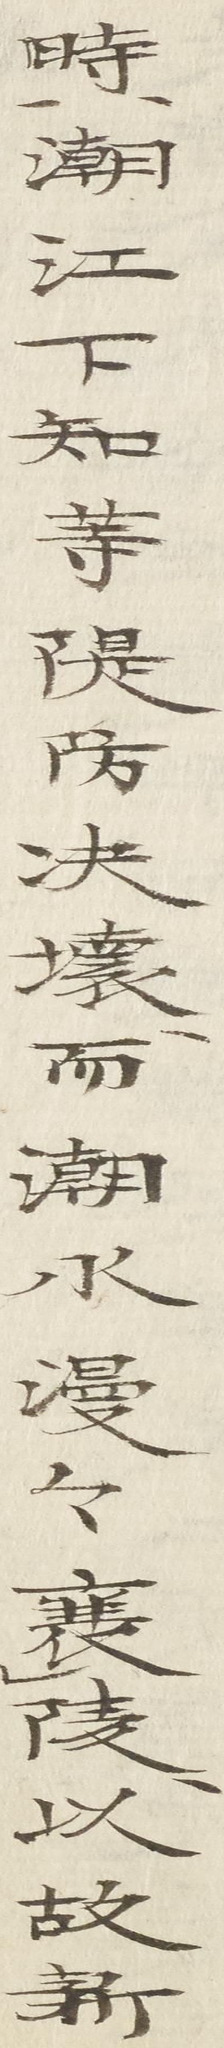時、潮江下知等堤防決壊、而潮水漫々襄陵以故新
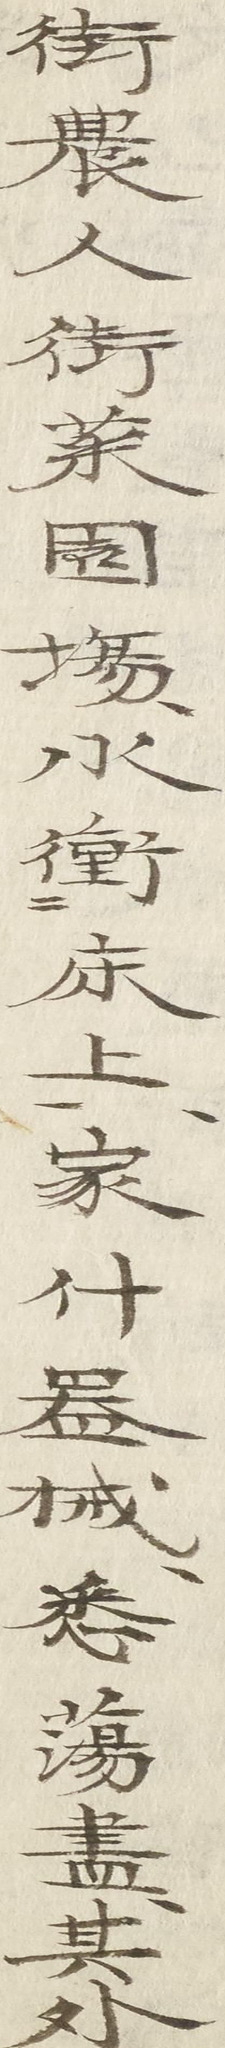街農人街菜園場水衝床上、家什器械、悉蕩盡、其外
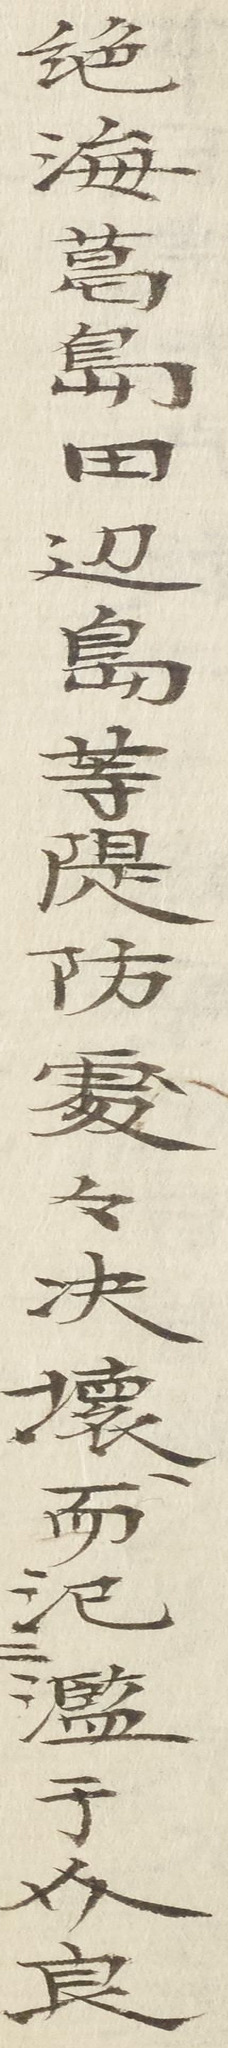絶海葛島田辺島等堤防処々決壊、而氾濫干介良
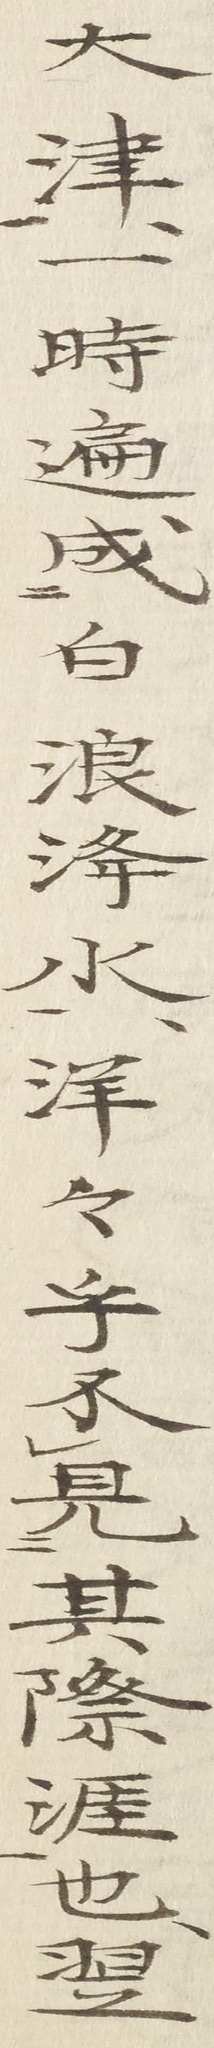大津、一時遍成白浪洚水、洋々乎不見是其際涯也、翌
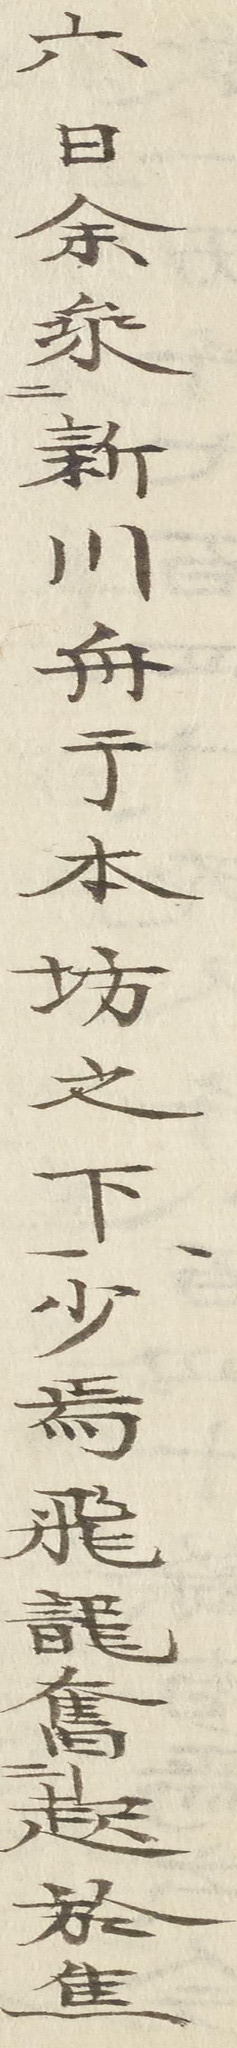六日余参新川舟干本坊之下、少焉飛龍奮起於焦
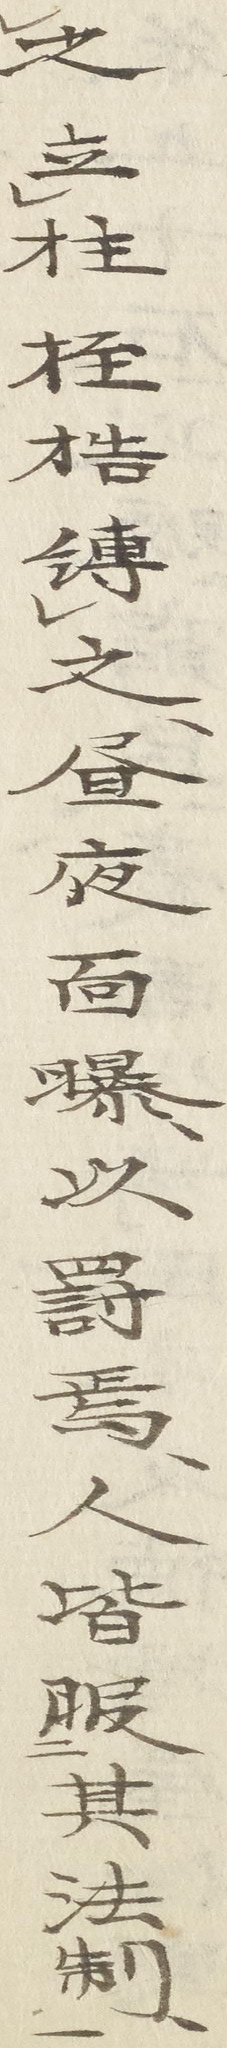之立柱桎梏縳之、昼夜靣曝以罰焉、人皆服其法制、
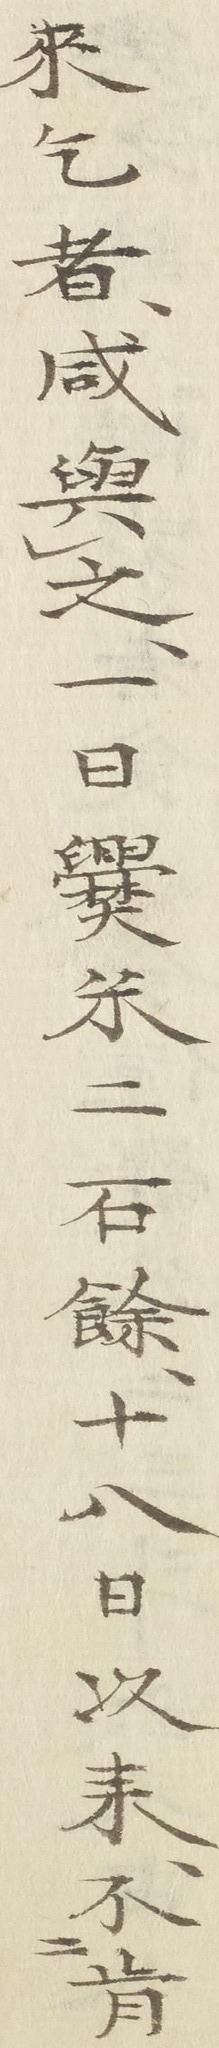来乞者、咸輿之、一日爨米二石餘、十八日以来、不肯

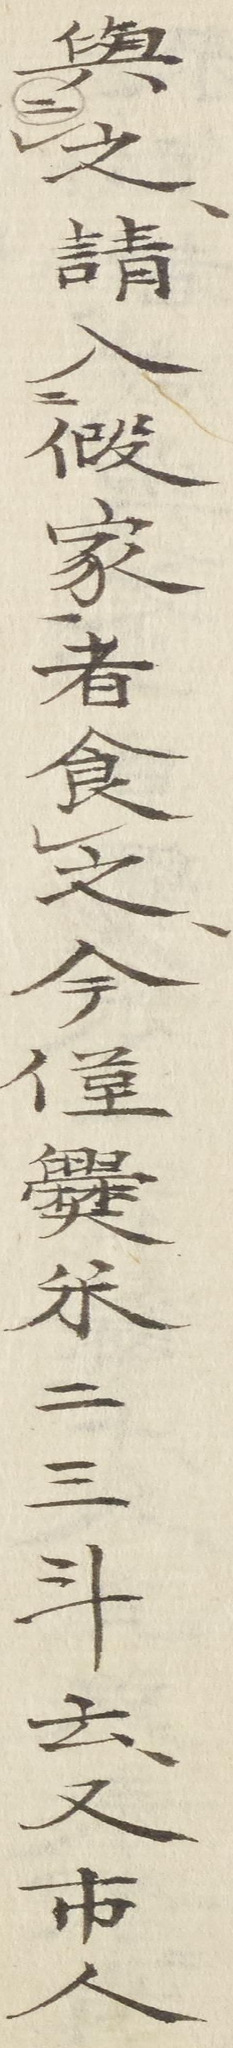与之、請入假家者食之、今僅爨米二三斗云、又市人
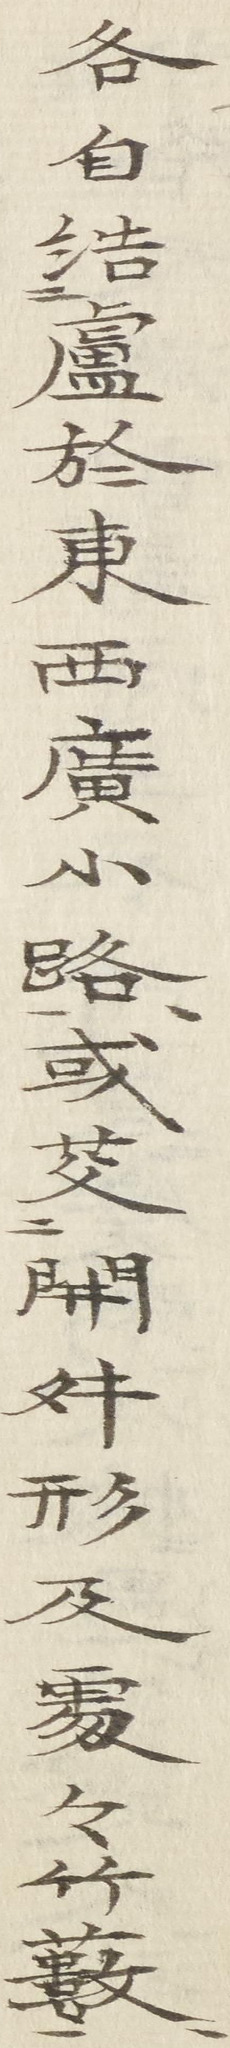各自結盧於東西広小路、或芠開舛形及処々竹藪、
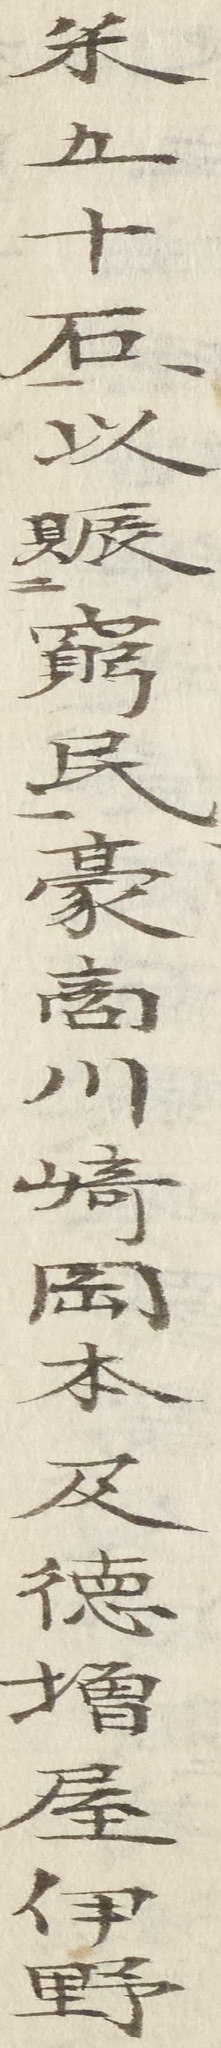米五十石、以賑窮民、豪商川崎岡本及徳増屋伊野
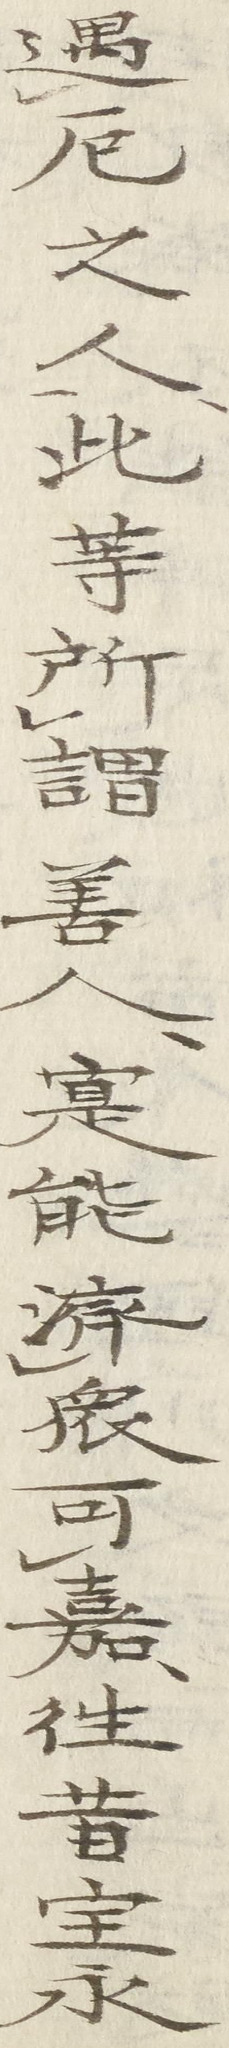遇厄之人此等所謂善人、寔能斉衆可嘉、往昔宝永
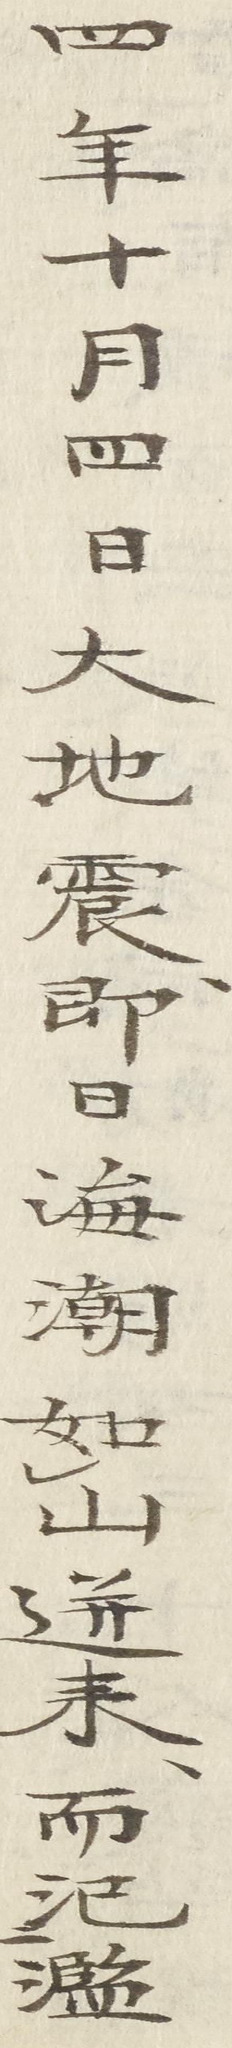四年十月四日大地震、即日海潮如山迸来、而氾濫
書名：地震記　下
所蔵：東京大学地震研究所図書室 Earthquake Research Institute Library, The University of Tokyo, JAPAN
